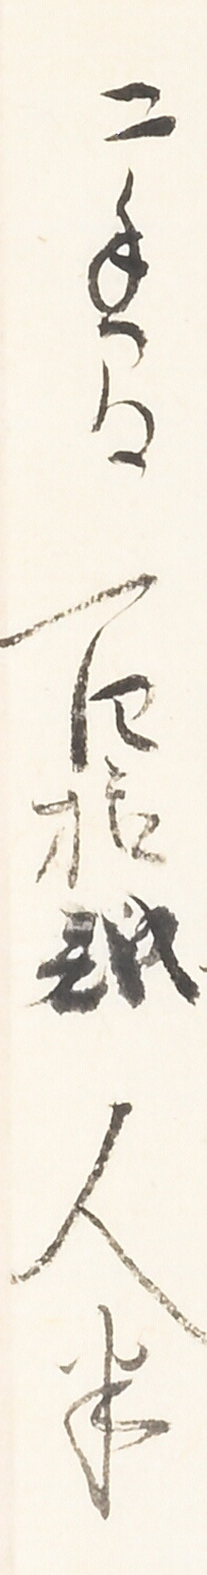工手間百拾弐人半
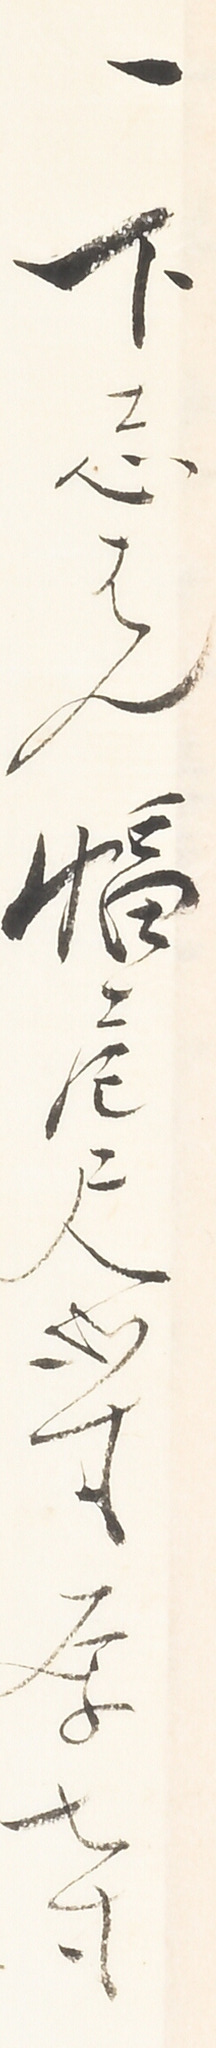一下しはん幅壱尺弐寸厚七寸
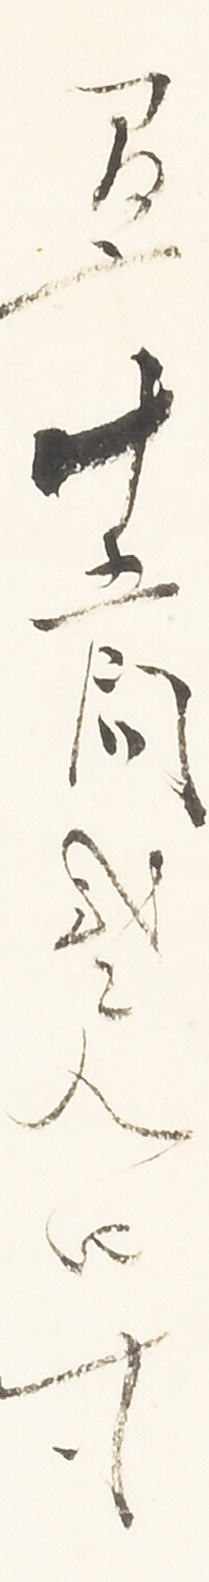間〆十五間弐尺四寸
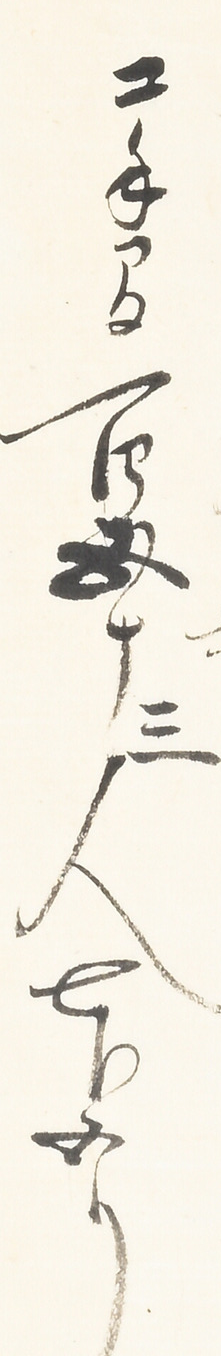工手間百五十三人七分五り

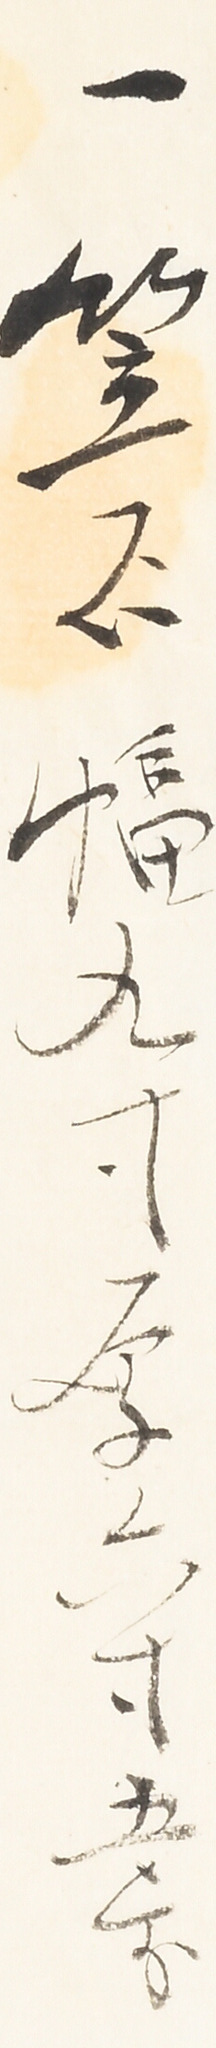一笠石幅九寸厚六寸五歩
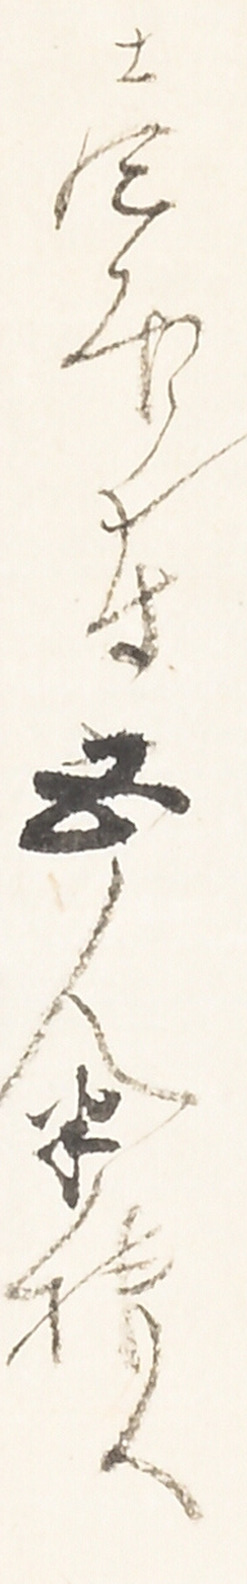壱本ニ付五人半積
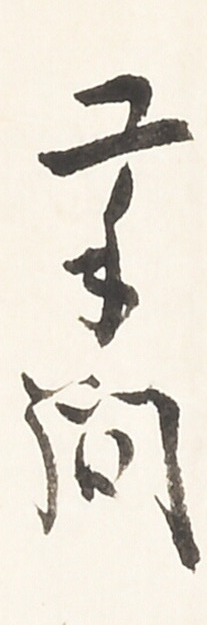工手間
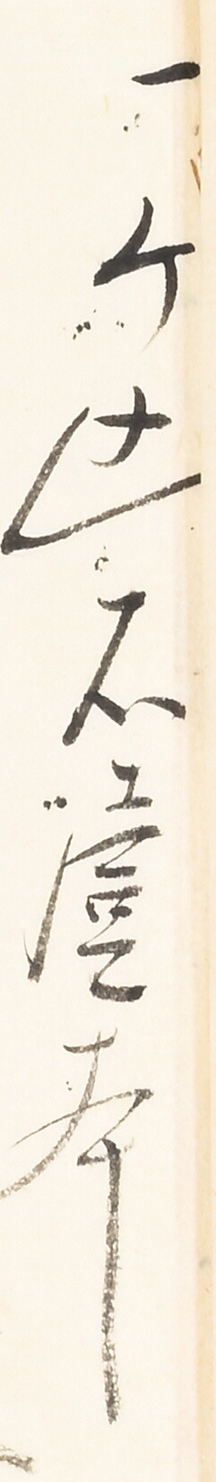一ケ込石壱本
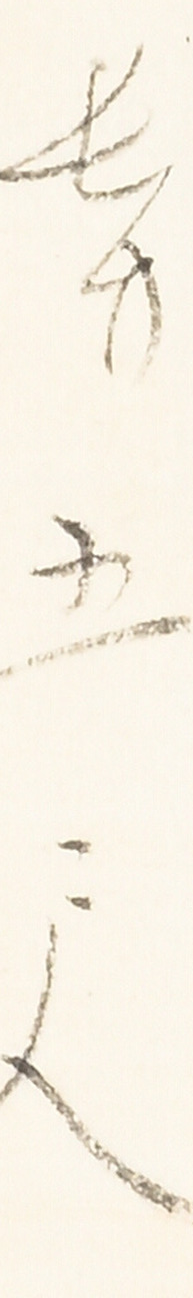長サ五尺
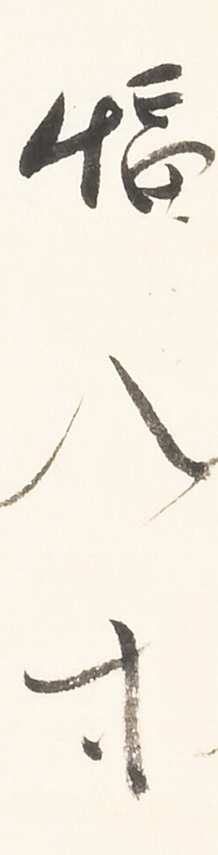幅八寸
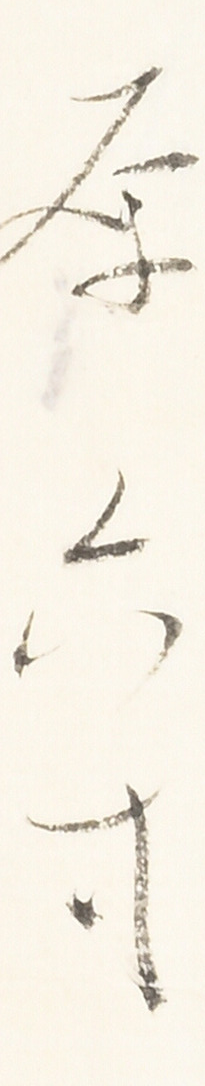厚六寸
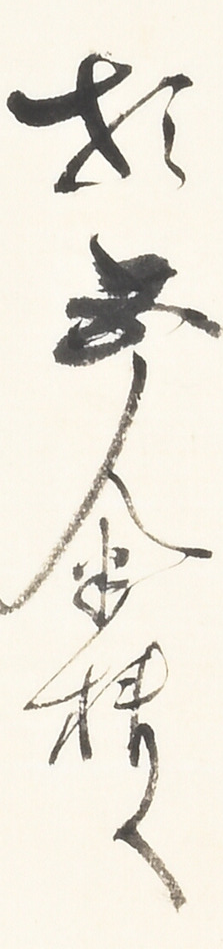拾五人半積

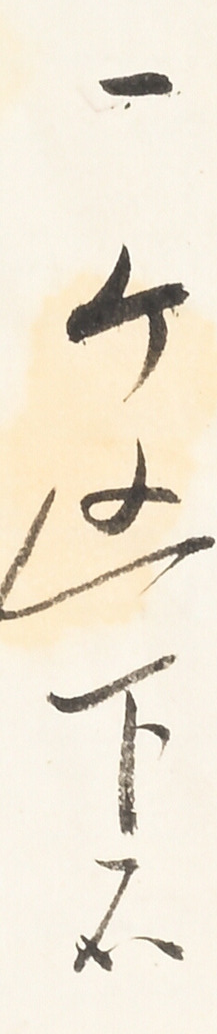一ケ込下石
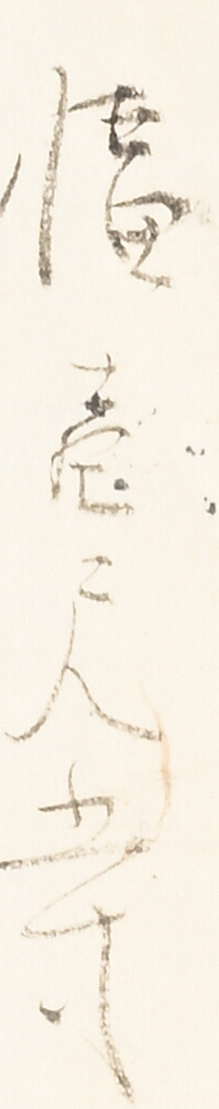幅壱尺五寸
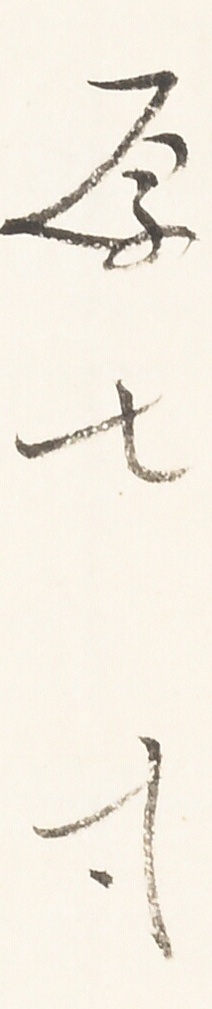厚七寸
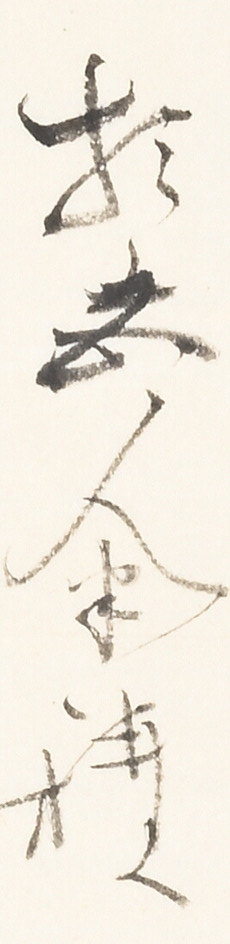拾五人半積
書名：天保十歳亥六月日玉垣御注文書上帳
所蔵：伊那市立高遠町図書館・合同会社AMANE
